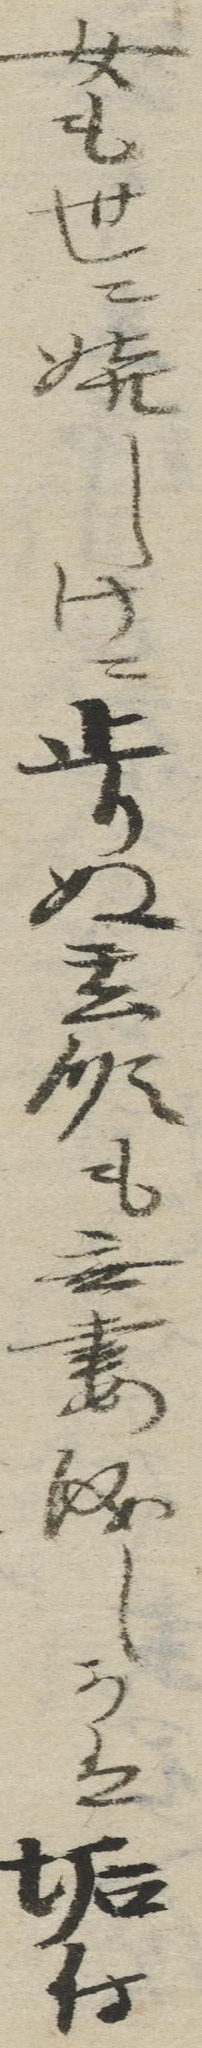女も世ニ嬉しけニ止りぬ玄順も無妻成しかは垢付
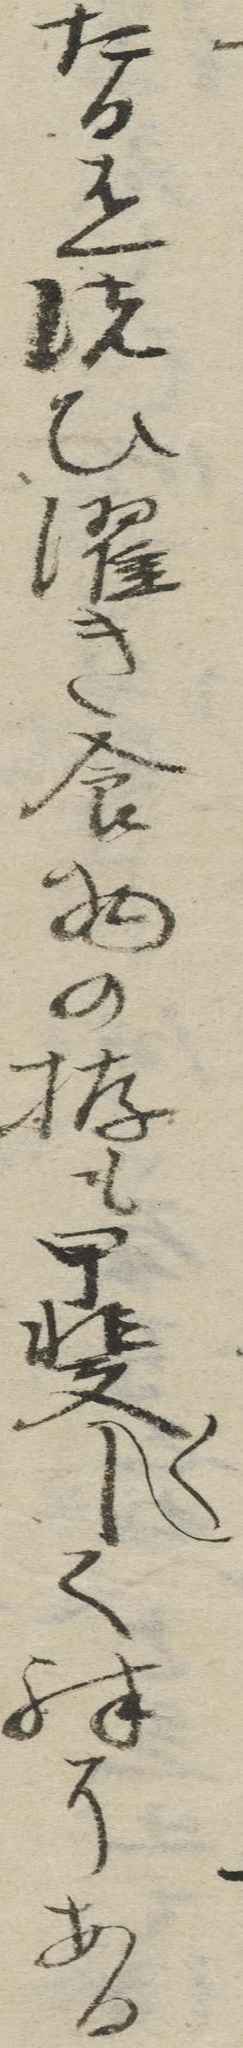たるを洗ひ濯き食物の拵も甲斐〳〵しく殊にある
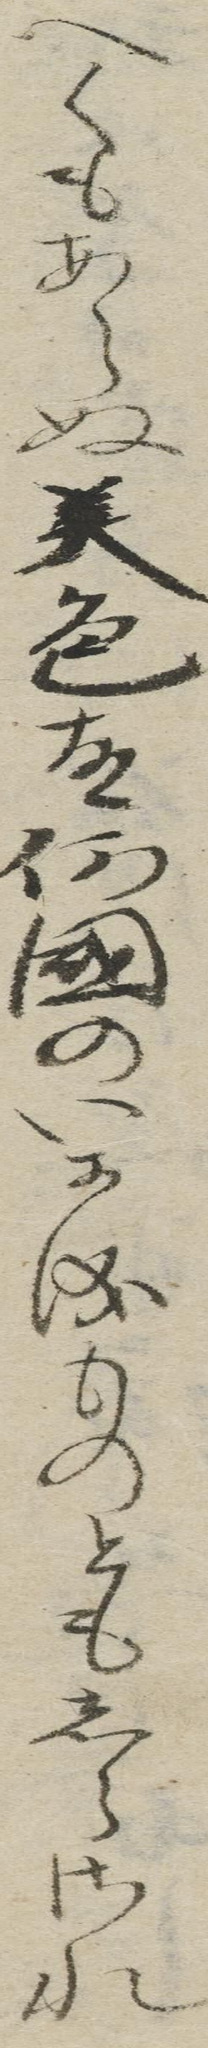へくもあらぬ美食故何国のいか成ものともしらされ
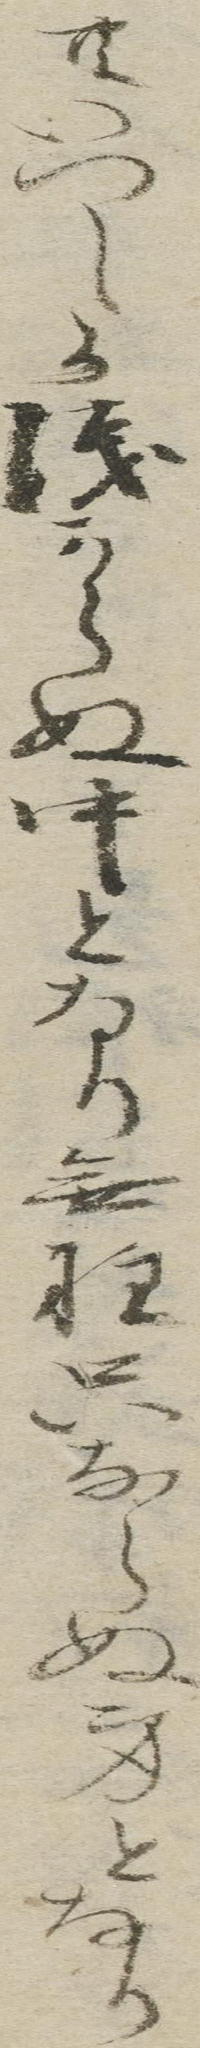共いつしか浅からぬ中となり無程只ならぬ身となり
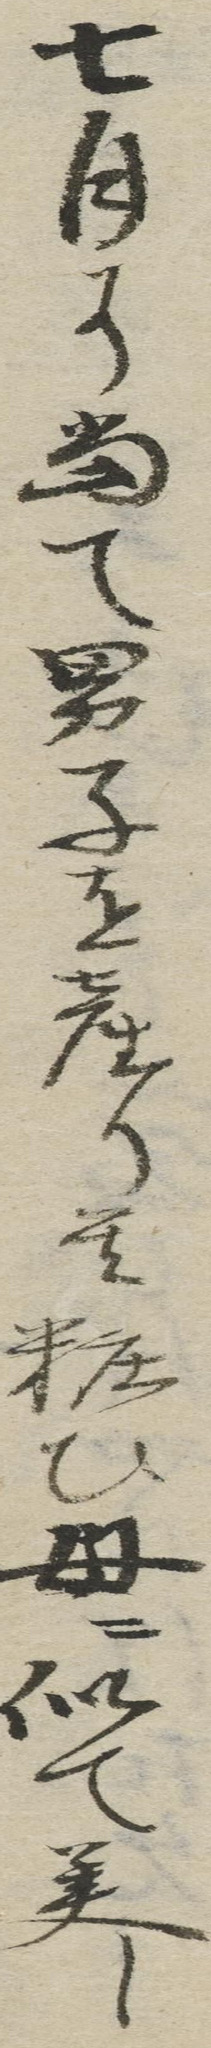七月に当て男子を産り其粧ひ母に似て美し
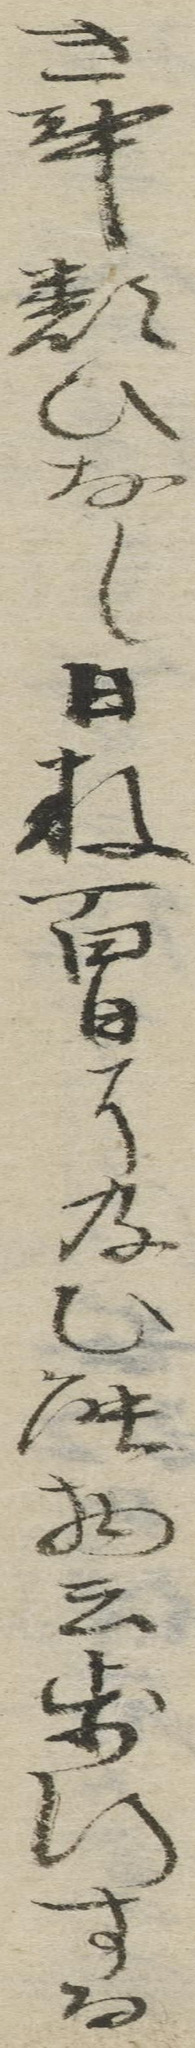き事類ひなし日数百日に及ひ能物云歩行する
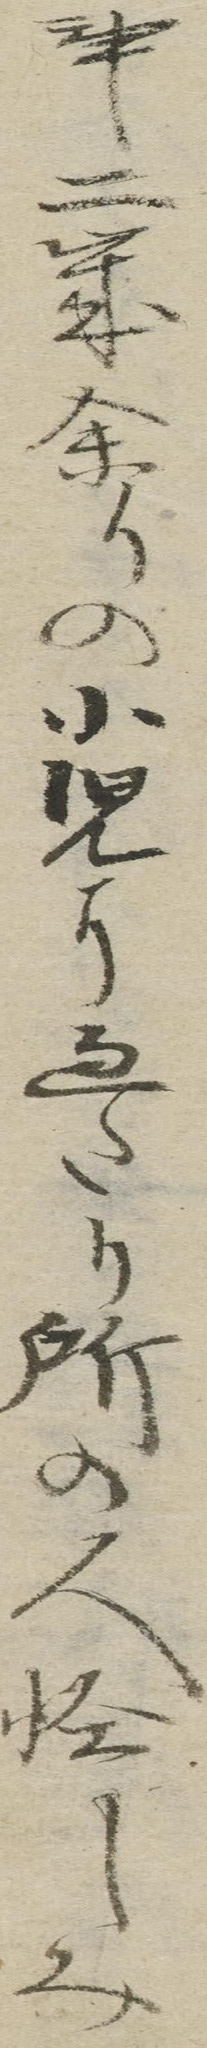事二歳余りの小児に過たり所の人怪しみ
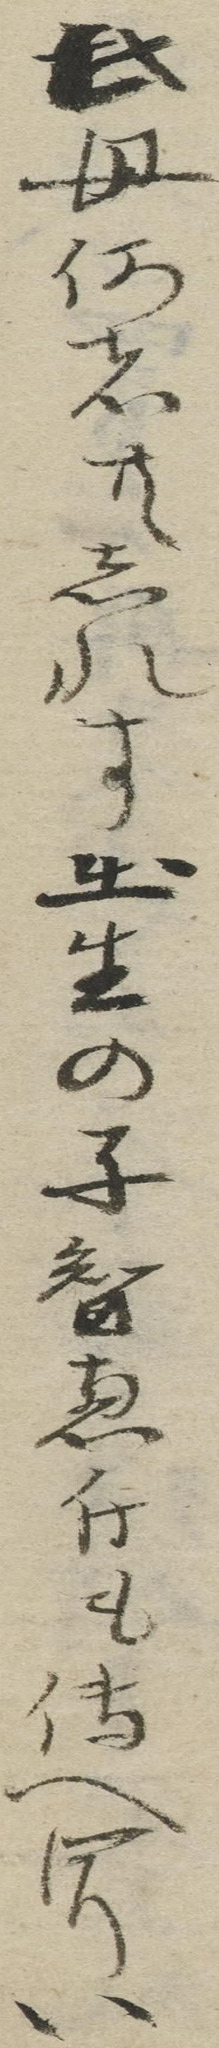此母何者共しれす出生の子知恵付も備へ聞ハ

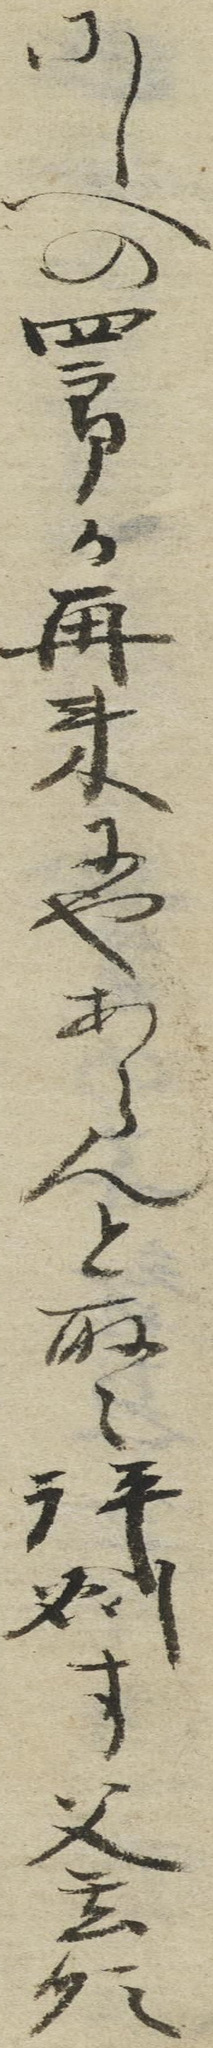にしへの四郎か再来にやあらんと取〻評判す父玄順
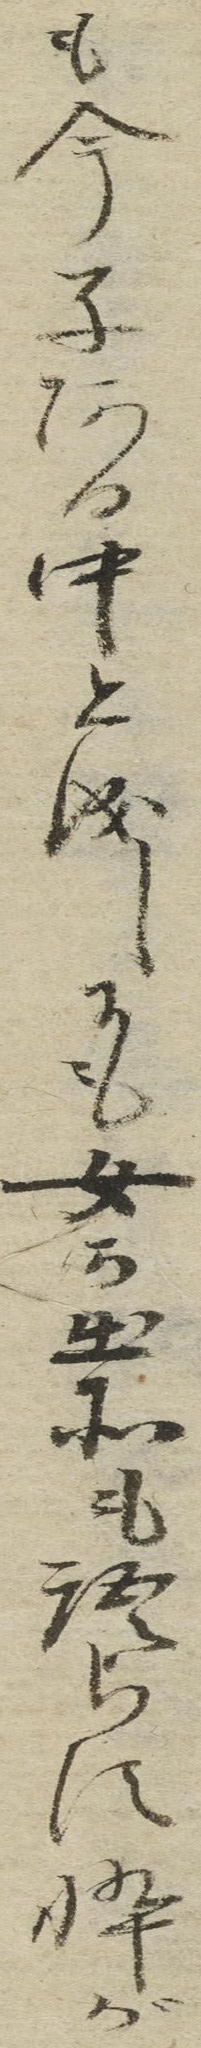も今子ある中と成しかも女が出所も語らす忰が
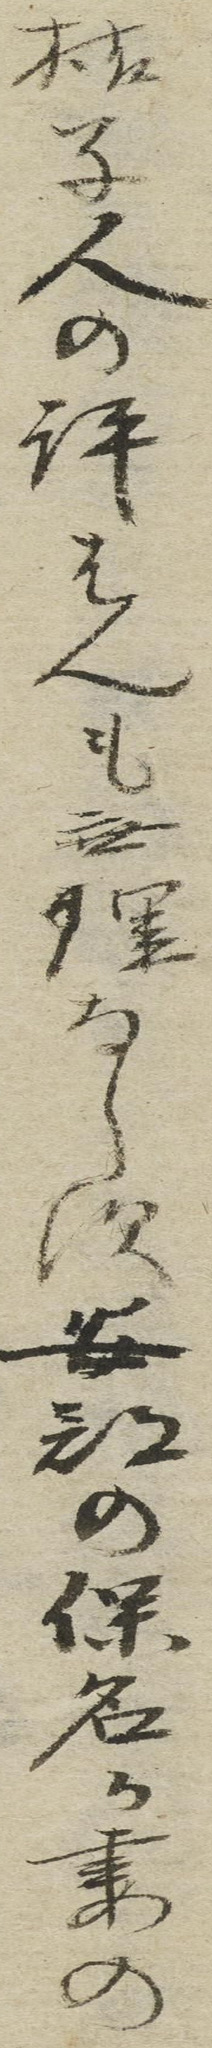様子人の評はんも無理ならす安部の保名か妻の
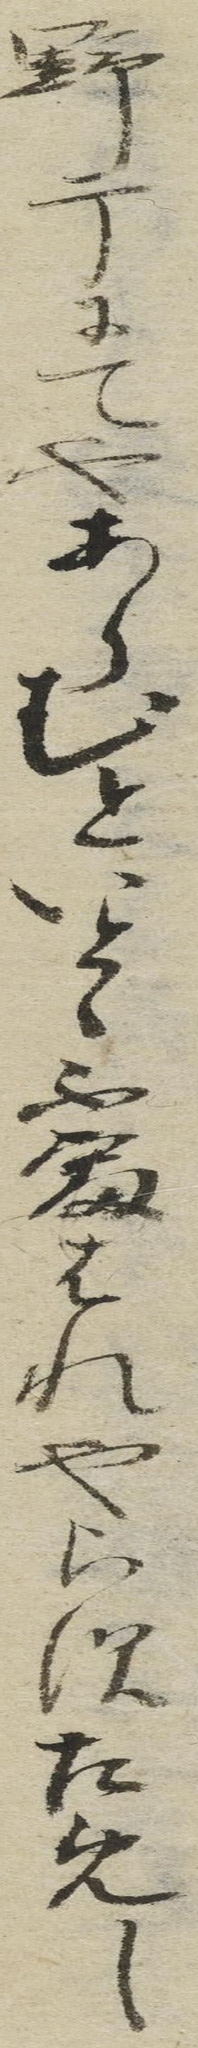野干にてやあらむといとゝ不審はれやらすためし
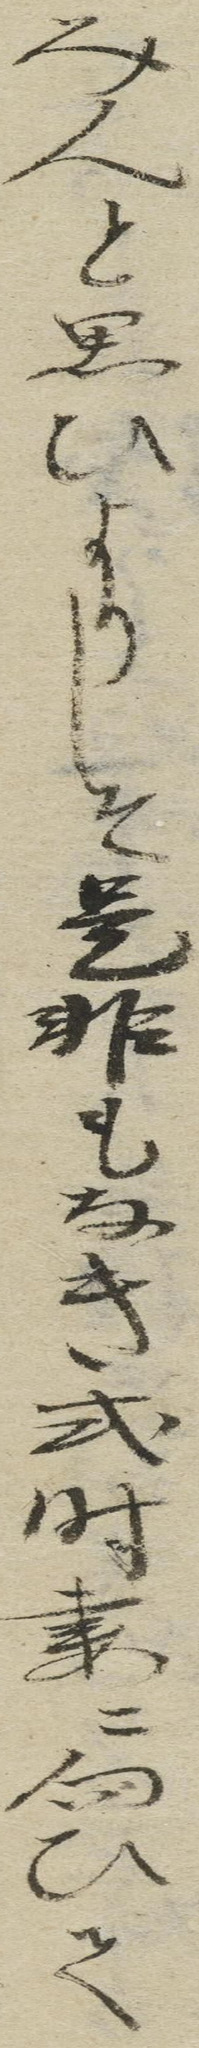みんと思ひよりしそ是非もなき或時妻ニ向ひて
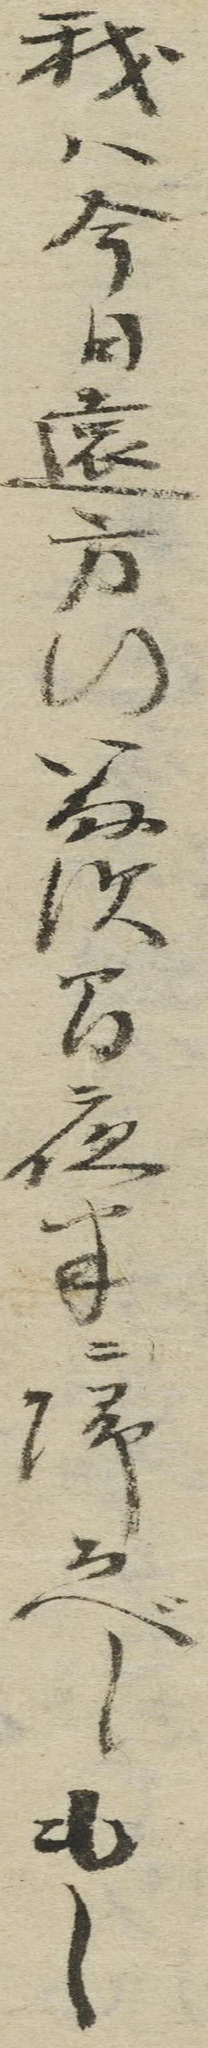我ハ今日遠方行いたす間夜半に帰るべしもし
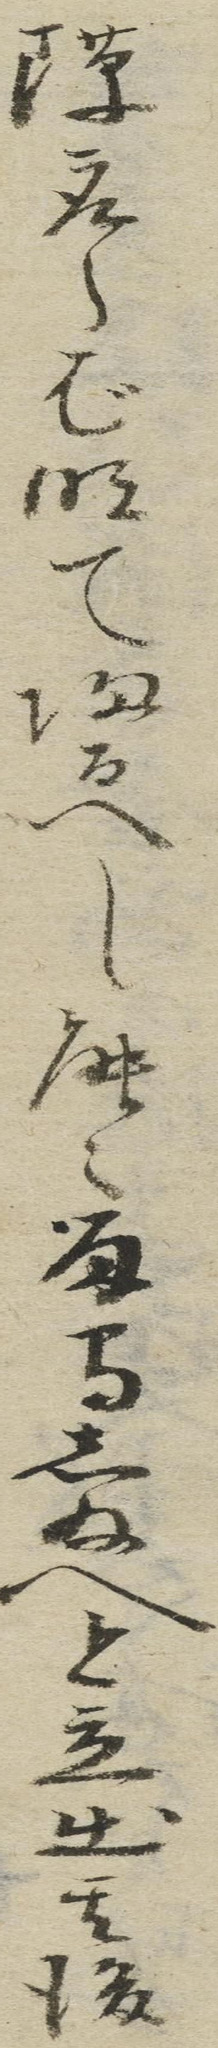隙取候ば明て帰るへし能〻留守し給へと立出其後
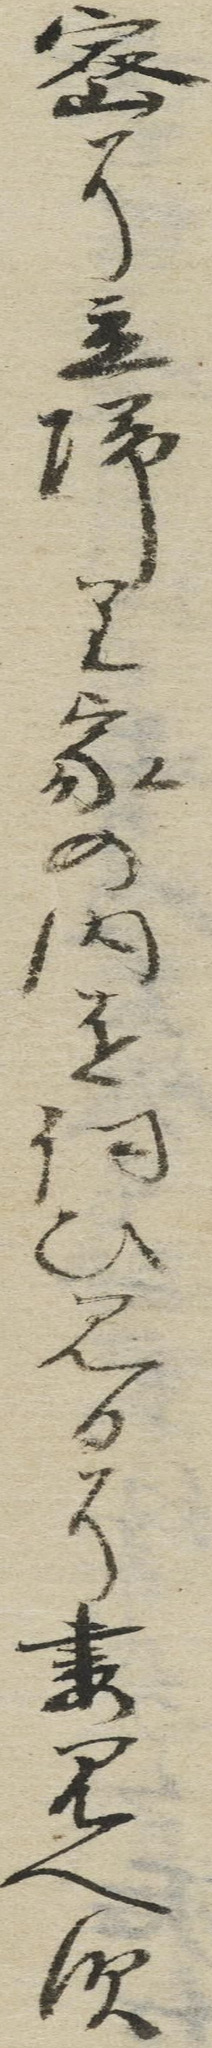密に立帰り家の内を伺ひ見るに妻見へす
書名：肥前國島原領普賢山大変記　完
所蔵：東京大学地震研究所図書室 Earthquake Research Institute Library, The University of Tokyo, JAPAN
